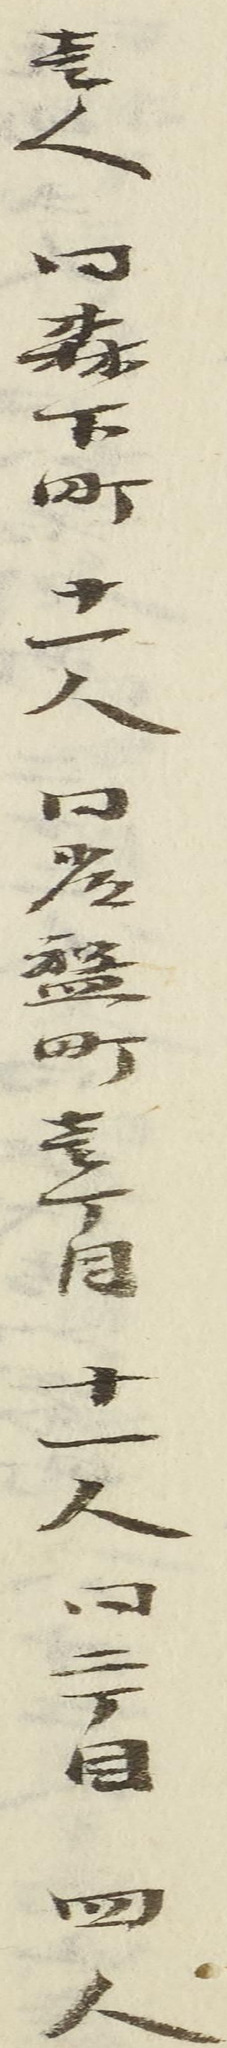壱人同森下町十一人同常盤町壱丁目十一人同二丁目四人
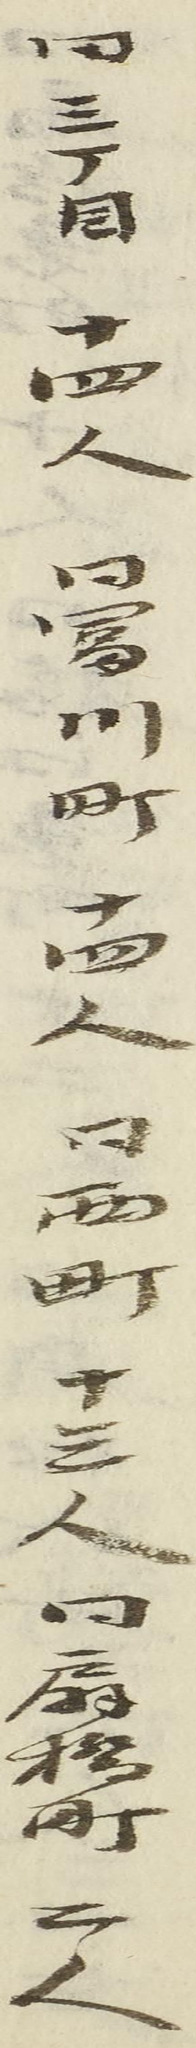同三丁目十四人同富川町十四人同西町十三人同扇横町二人

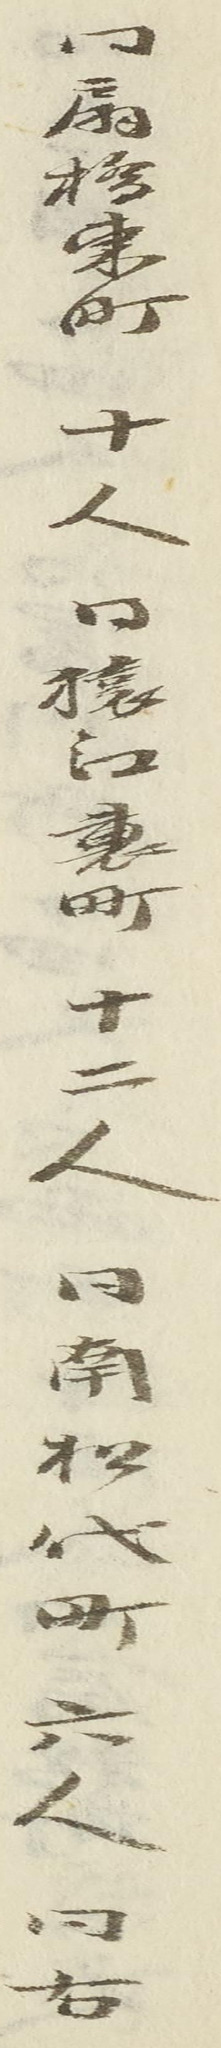同扇横東町十人同猿江裏町十二人同南松代町六人同古
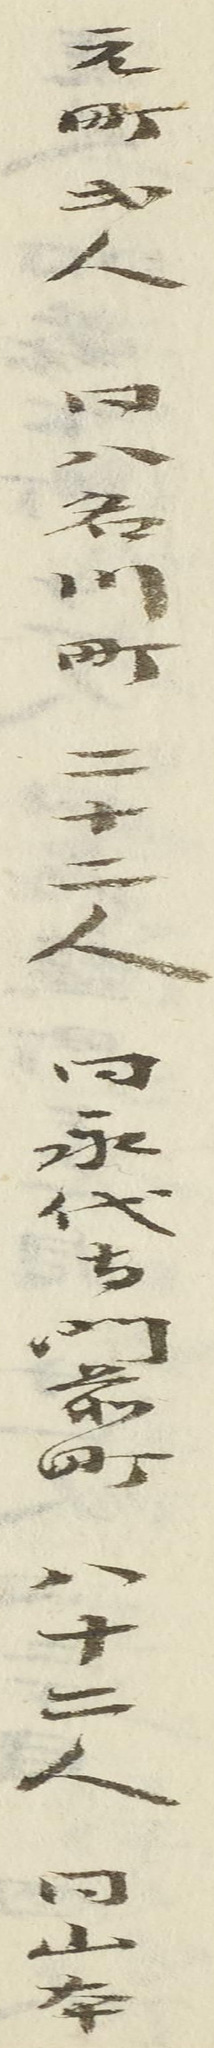元町弐人同八名川町二十二人同永代寺門前町八十二人同山本
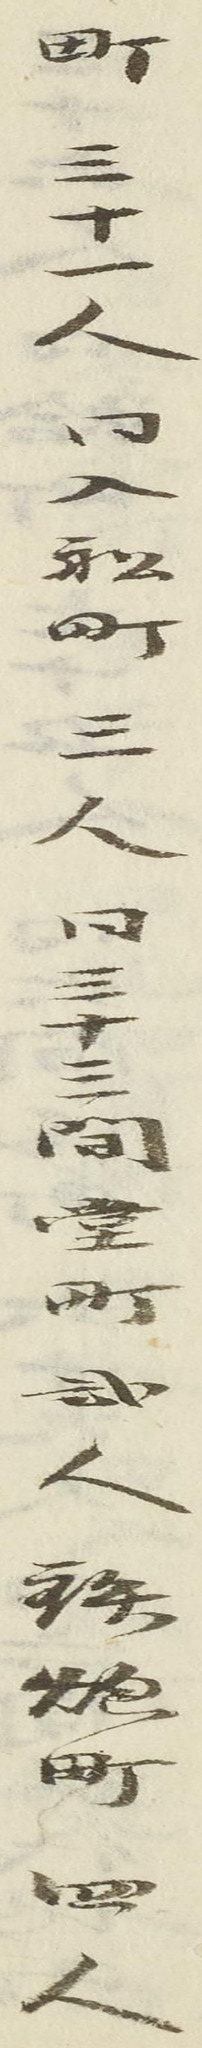町三十一人同入船町三人同三十三間堂町弐人鉄炮町四人
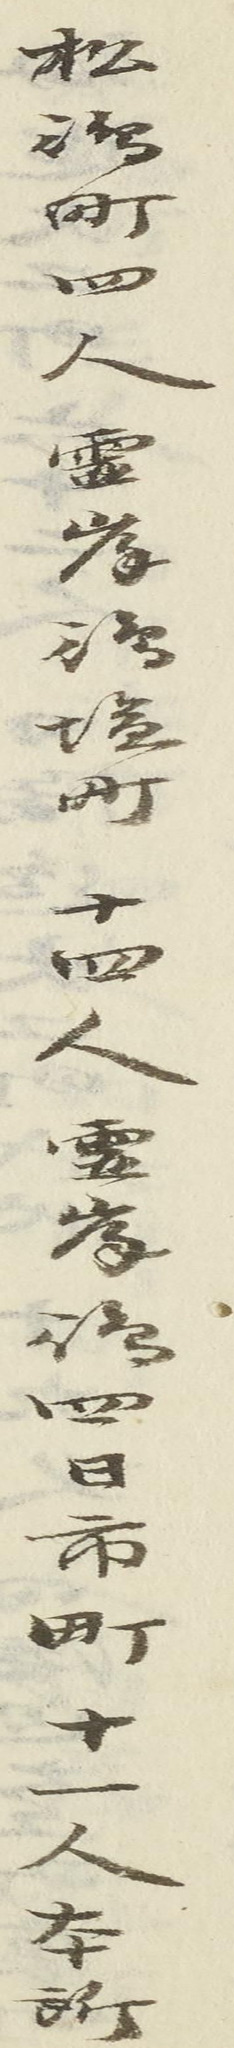松嶋町四人霊岸嶋塩町十四人霊岸嶋四日市町十一人本所
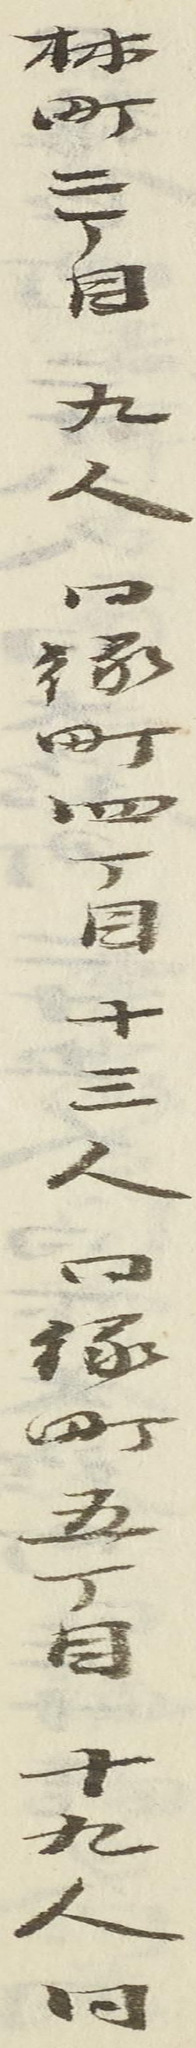林町二丁目九人同緑町四丁目十三人同緑町五丁目十九人同
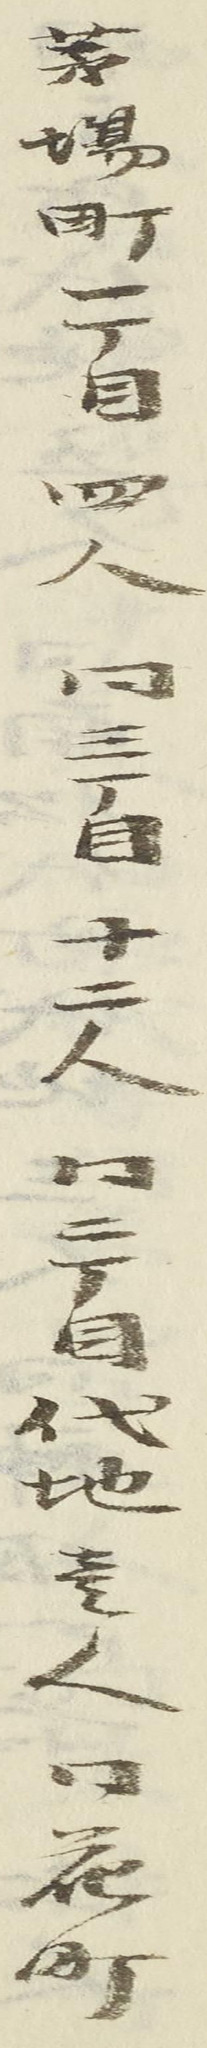茅場町一丁目四人同三丁目十二人同二丁目代地壱人同花町
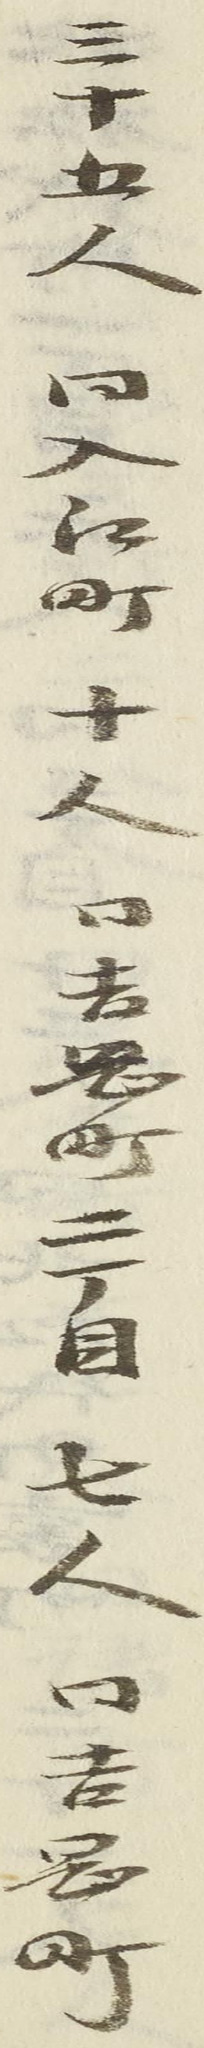三十五人同入江町十人同吉岡町二丁目七人同吉岡町
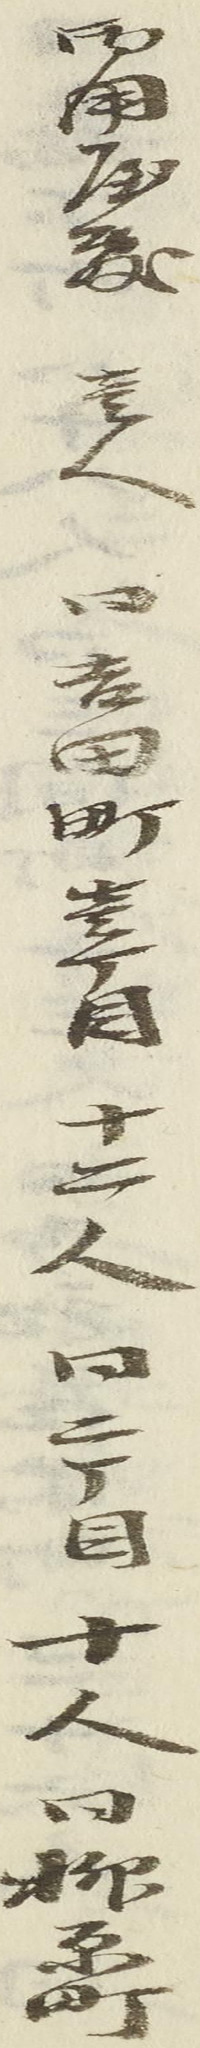御用屋敷壱人同吉田町壱丁目十二人同二丁目十人同柳原町
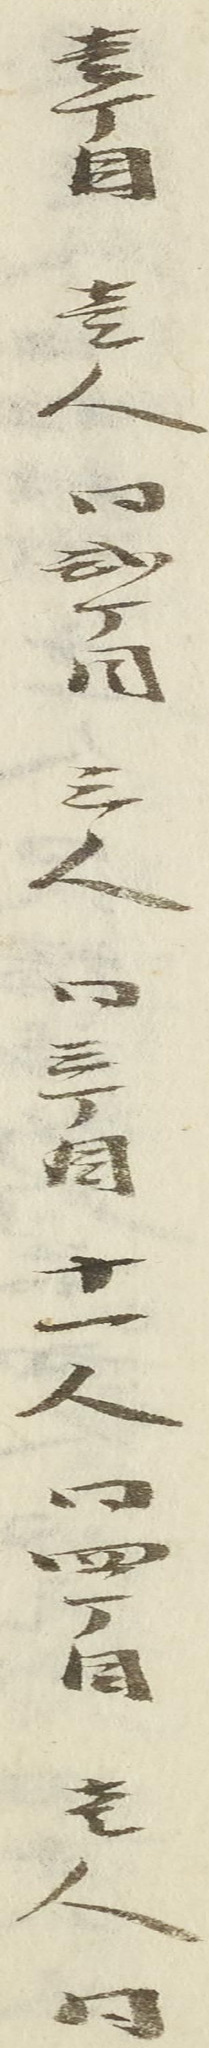壱丁目壱人同弐丁目三人同三丁目十一人同四丁目壱人同
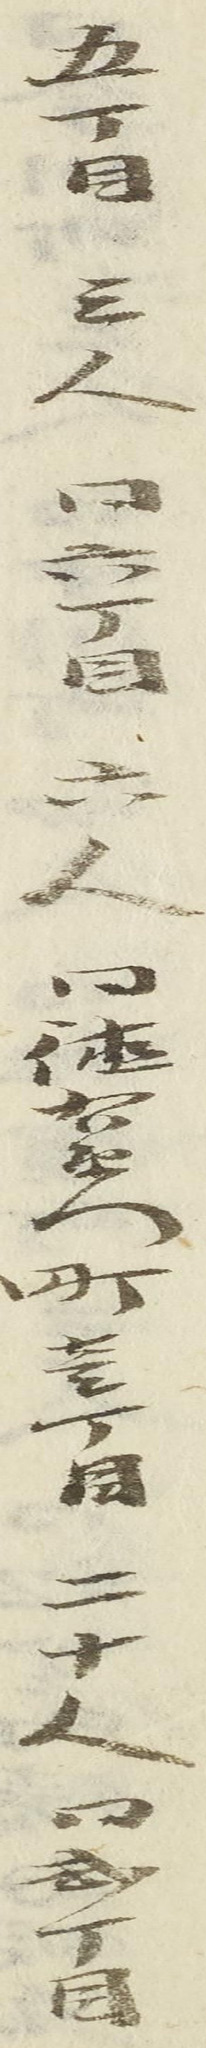五丁目三人同六丁目六人廿同徳右衛門町壱丁目二十人同弐丁目
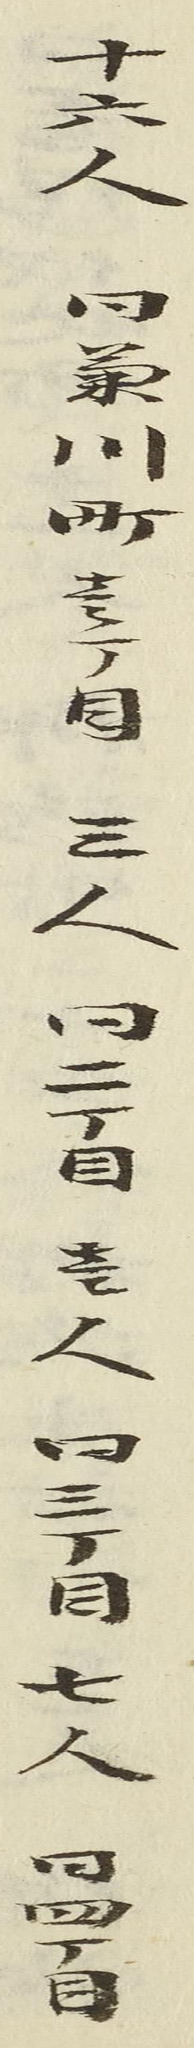十六人同菊川町壱丁目三人同二丁目壱人同三丁目七人同四丁目
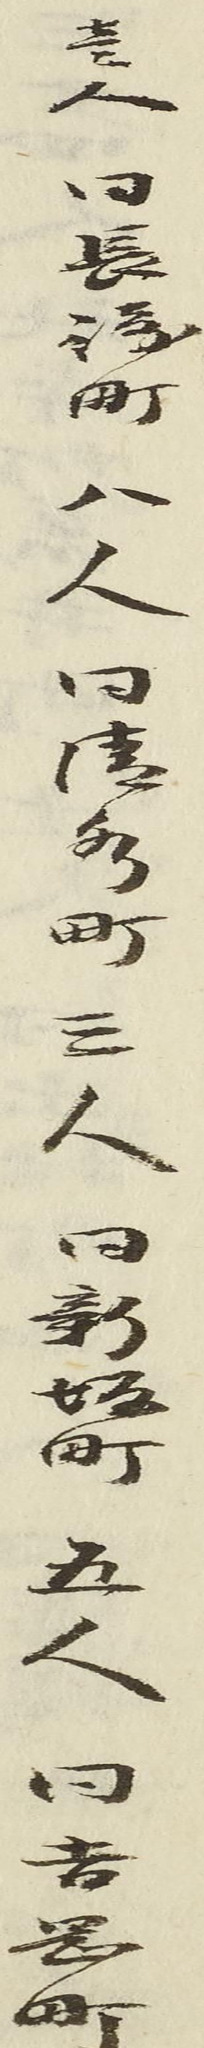壱人同長崎町八人同清水町三人同新坂町五人同吉岡町
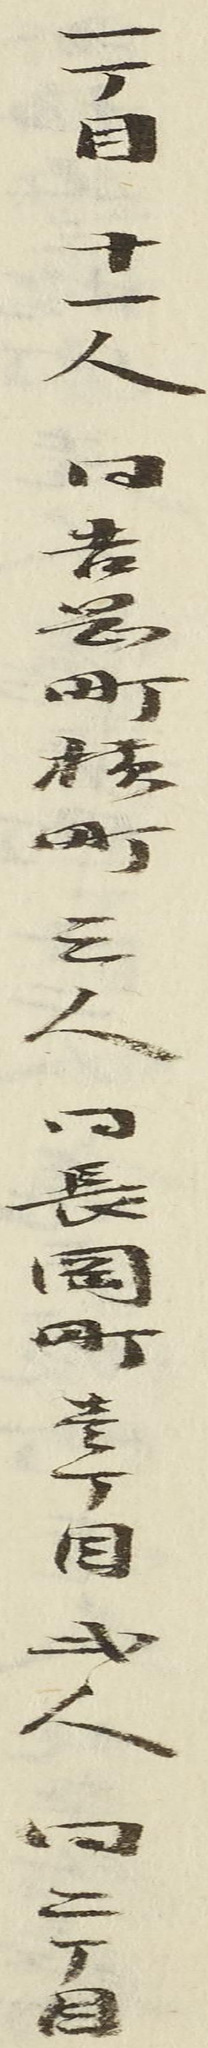一丁目十一人同吉岡町横町三人同長岡町壱丁目弐人同二丁目
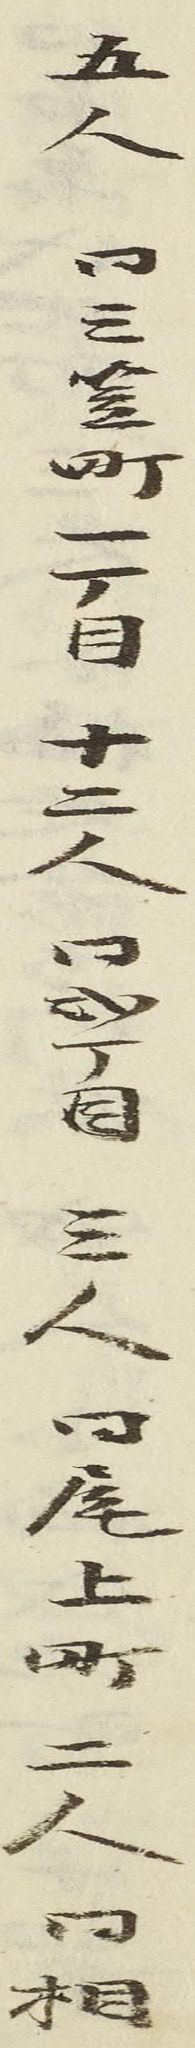五人同三笠町一丁目十二人同弐丁目三人廿同尾上町二人同相
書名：那為の後見艸　全
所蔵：東京大学地震研究所図書室 Earthquake Research Institute Library, The University of Tokyo, JAPAN
